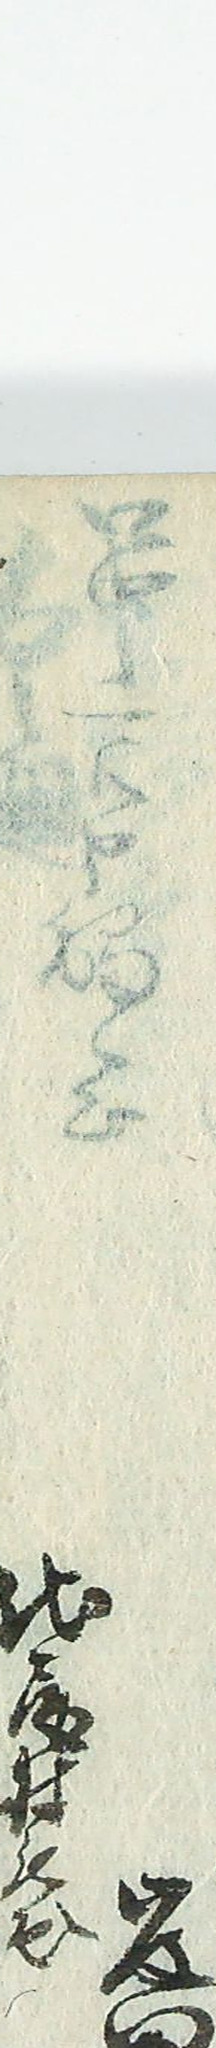池尻村庄屋
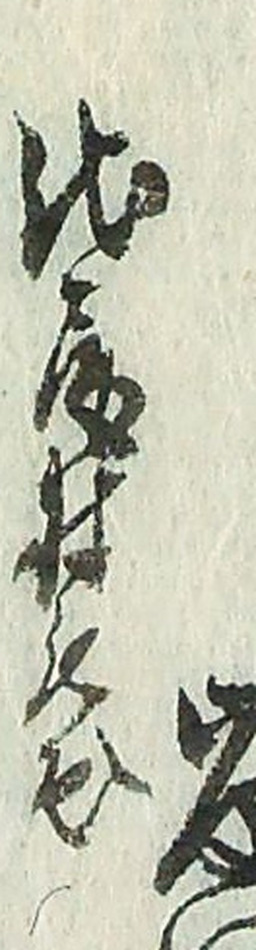早淵村庄屋
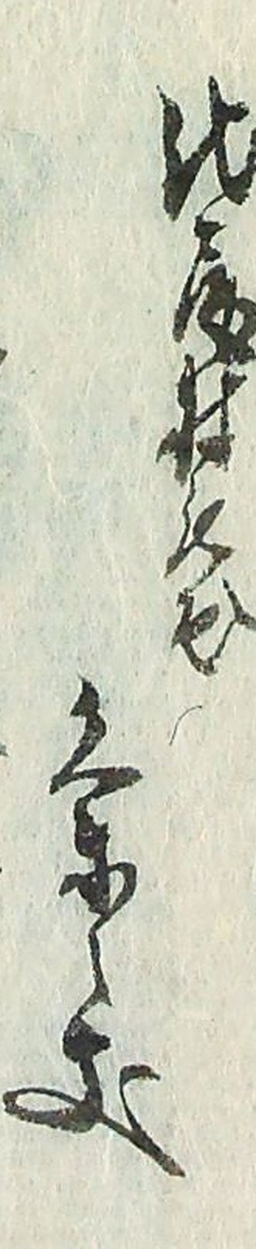久米之丈
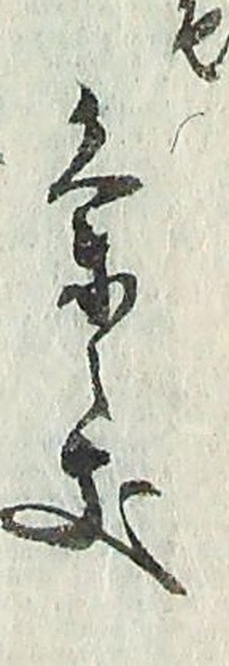久米之丈
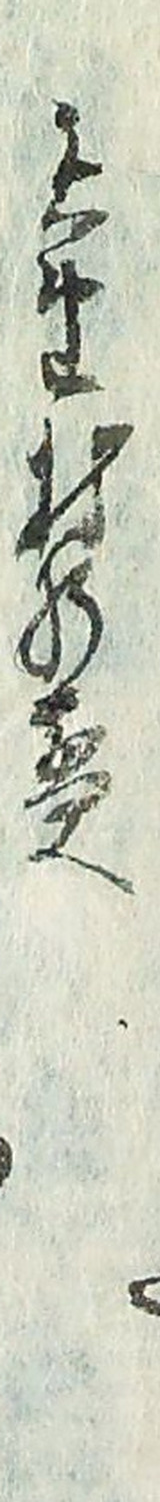真野村肝煎
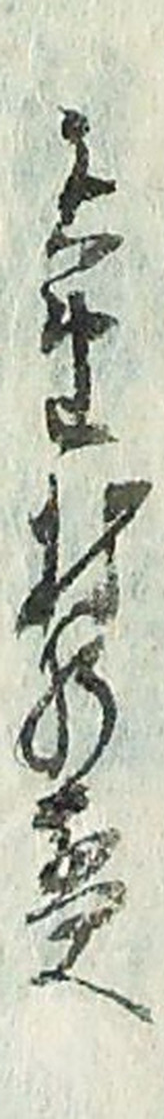真野村肝煎
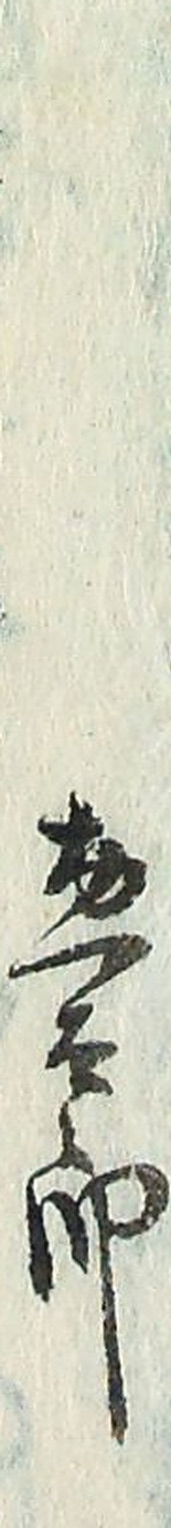惣太郎
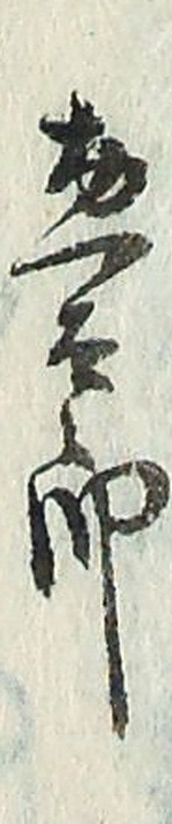惣太郎
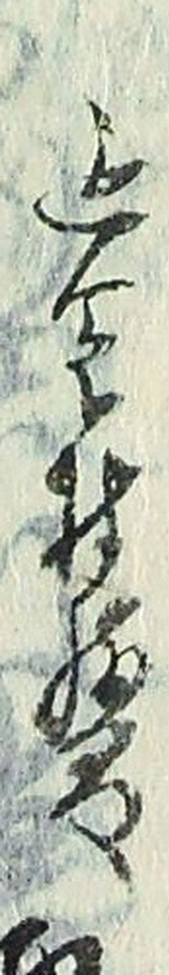延命村肝煎
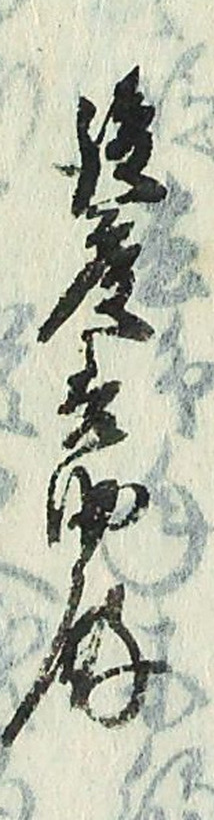後藤善助殿
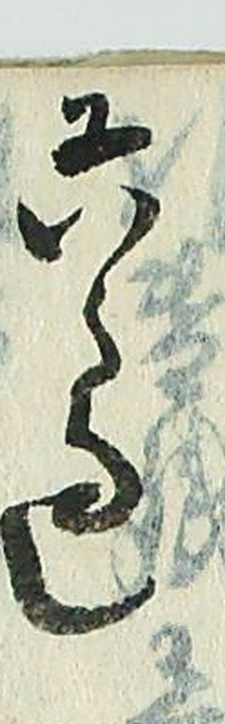右之通
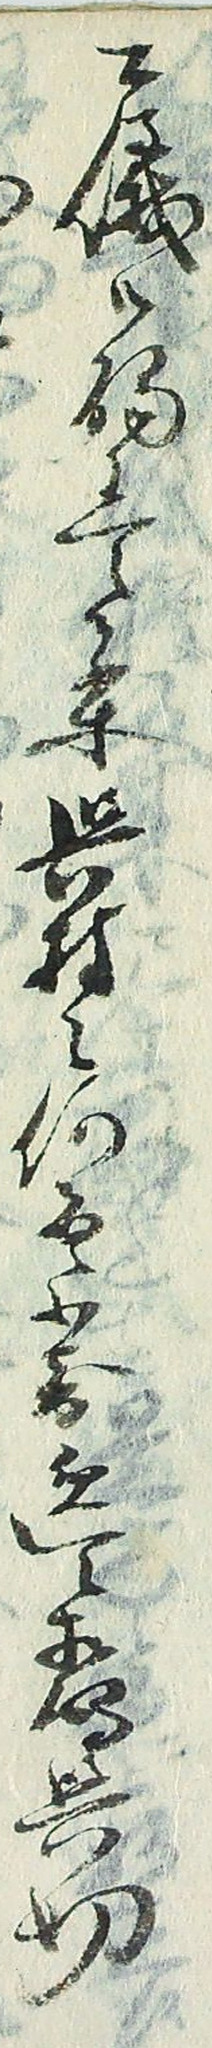公儀御触有之候条与村々何者に不寄逸々相触与切
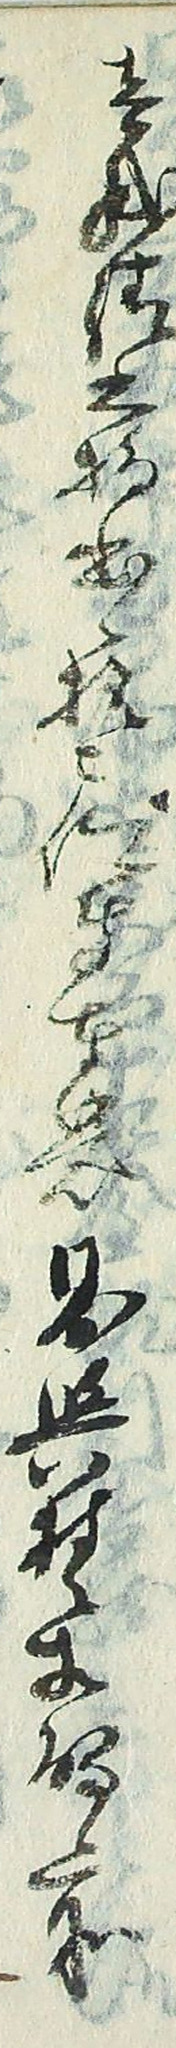壱紙請書指出候様被仰付奉畏則与村々相触候所
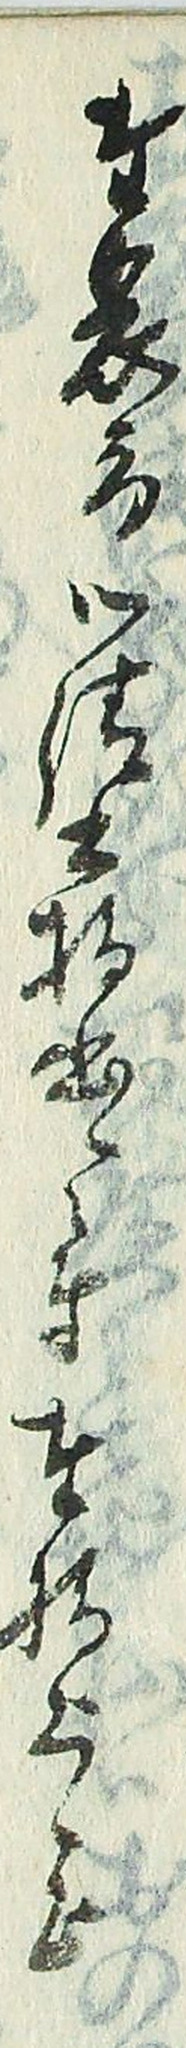奉畏旨御請書指出候に付奉指上候以上
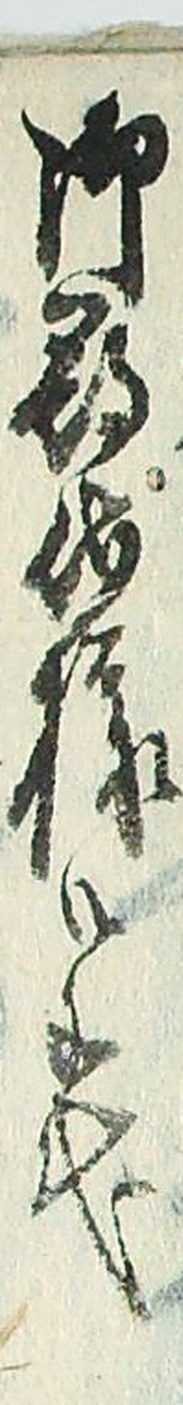御郡代様御手代
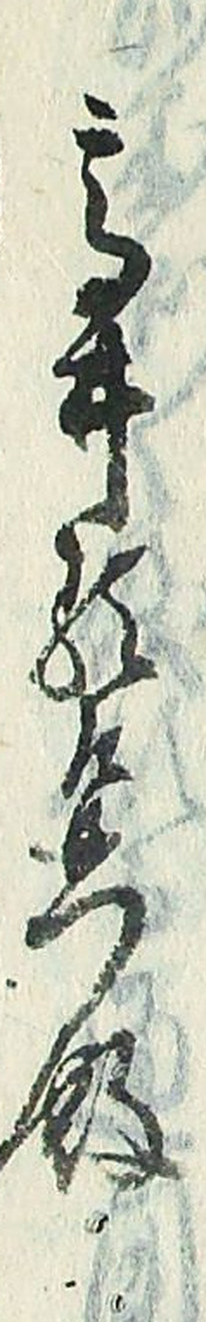高井類左衛門殿
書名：諸御用御□受書控
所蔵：鳴門教育大学 Naruto University of Education
